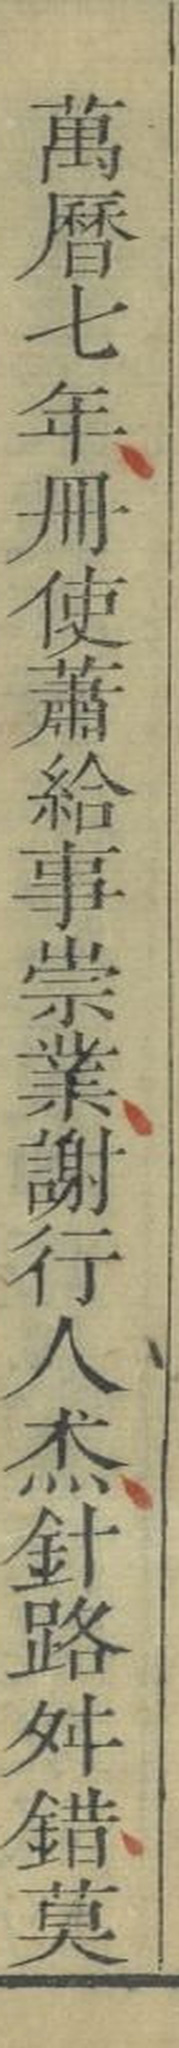萬曆七年冊使蕭給事崇業謝行人然針路舛錯莫
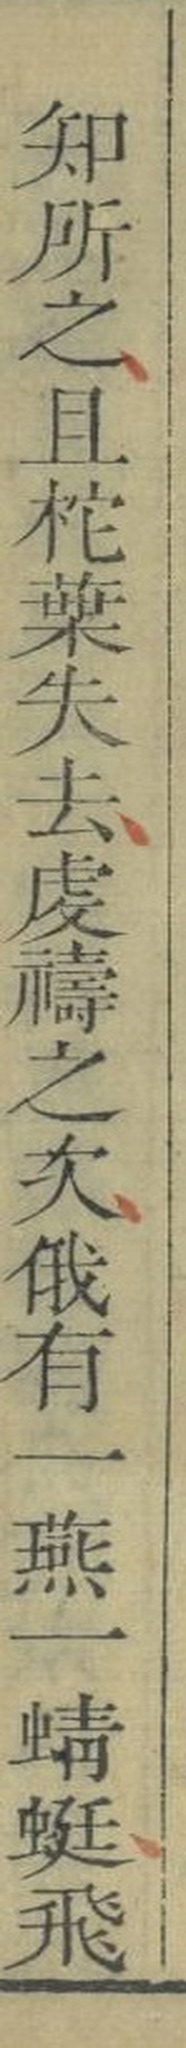知所之且柁葉失去䖍禱之次俄有一燕一蜻蜓飛
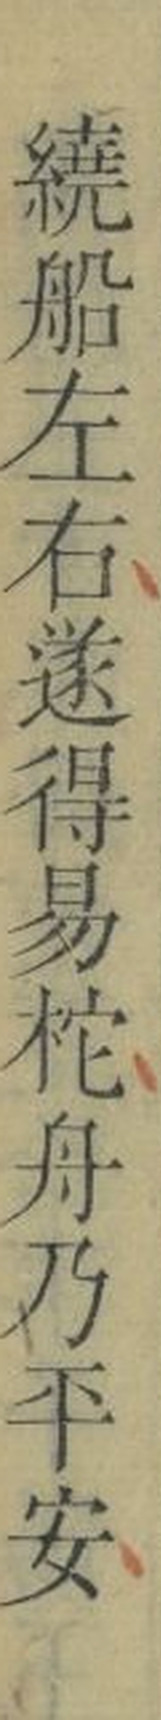繞船左右遂得易柁舟乃平安

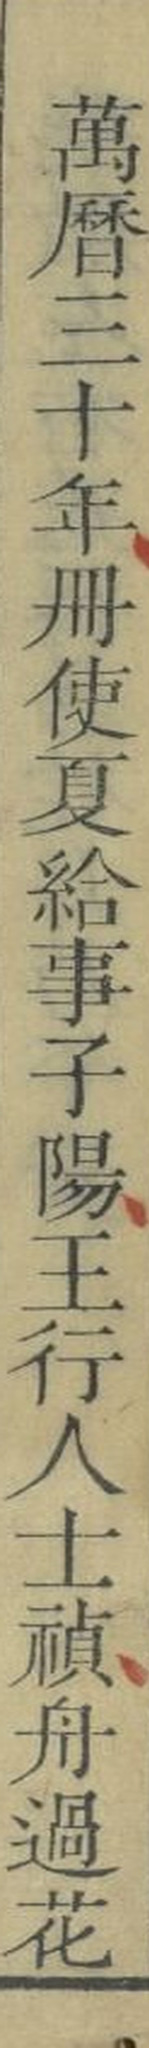萬曆三十年冊使夏給事子陽王行人士禎舟過花
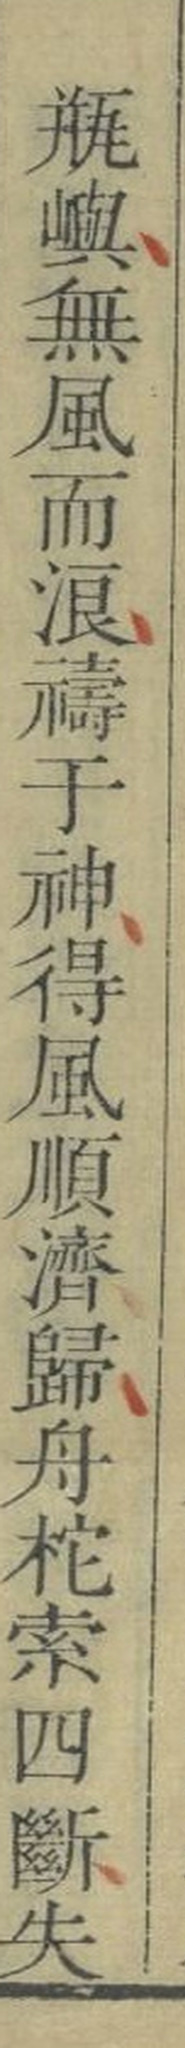瓶嶼無風而浪禱于神得風順濟歸舟柁索四斷失
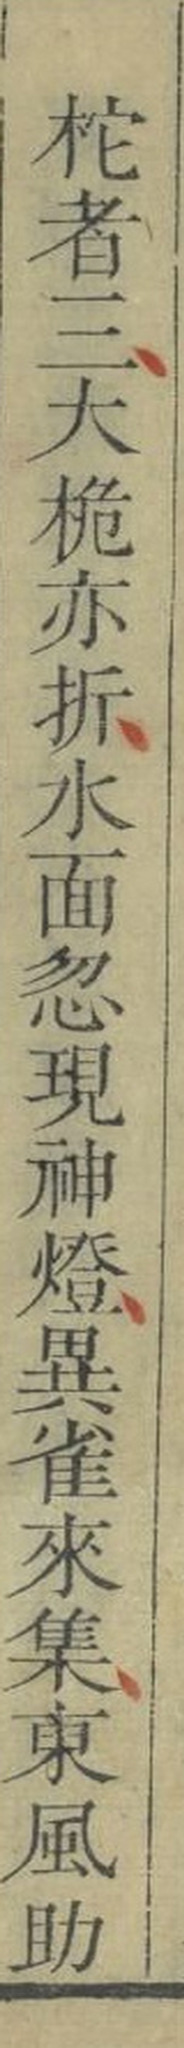柁者三大桅亦折水面忽現神燈異雀來集東風助
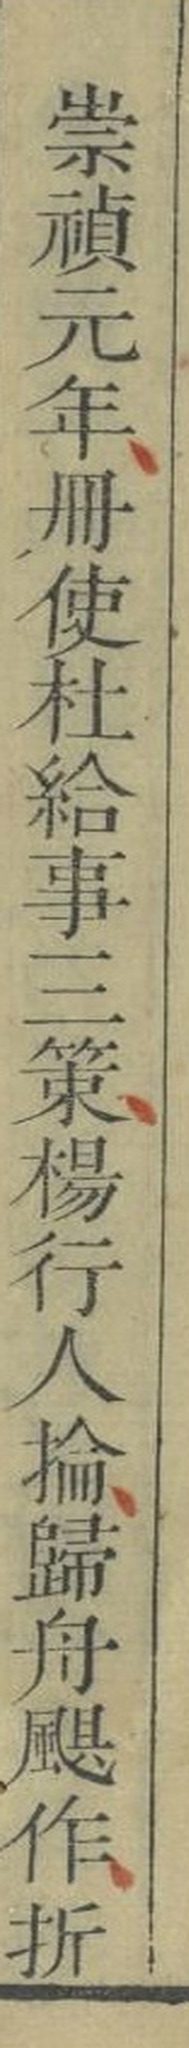崇禎元年冊使杜給事三策楊行人掄歸舟颶作折
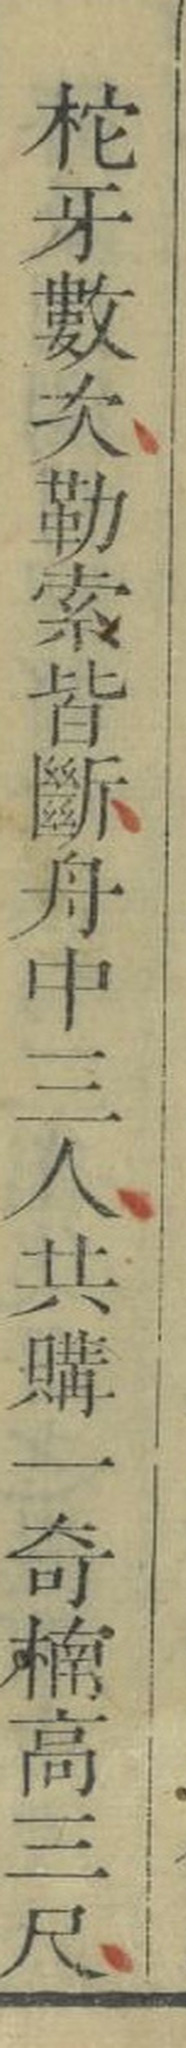柁牙數次勒索皆斷舟中三人共購一奇楠高三尺
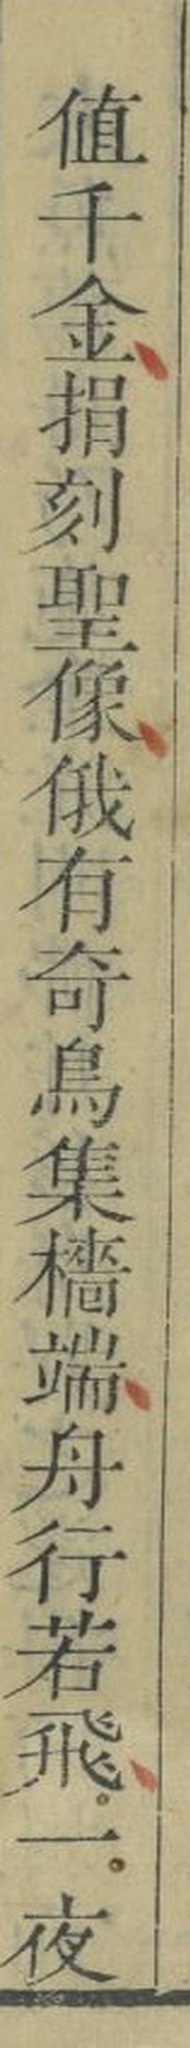値千金捐刻聖像俄有奇鳥集檣端舟行若飛一夜
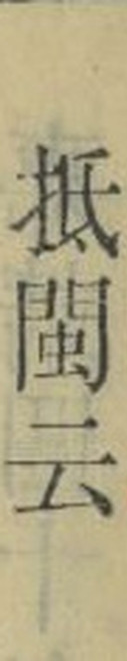抵閩云
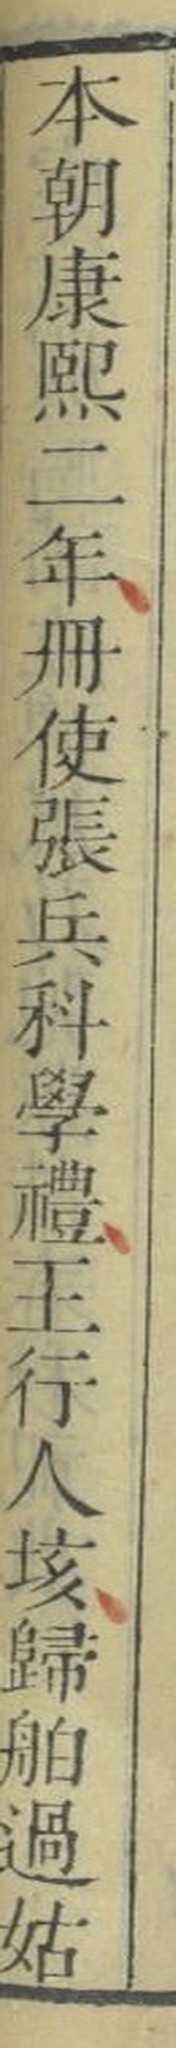本朝康熙二年冊使張兵科學禮王行人垓歸舶過姑
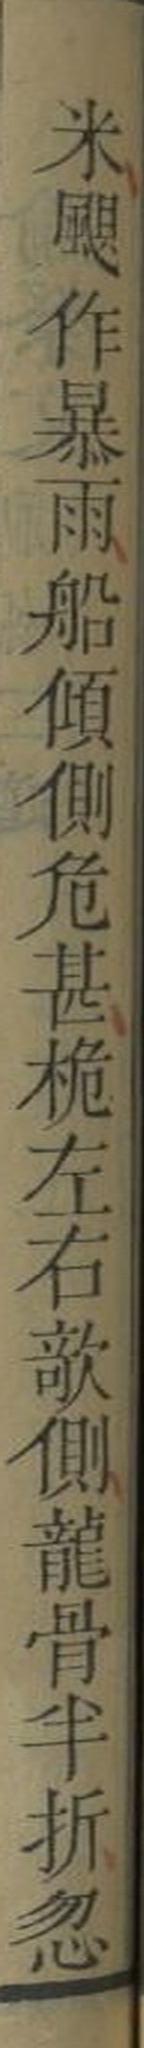米颶作暴雨船傾側危甚桅左右欹側龍骨半折忽
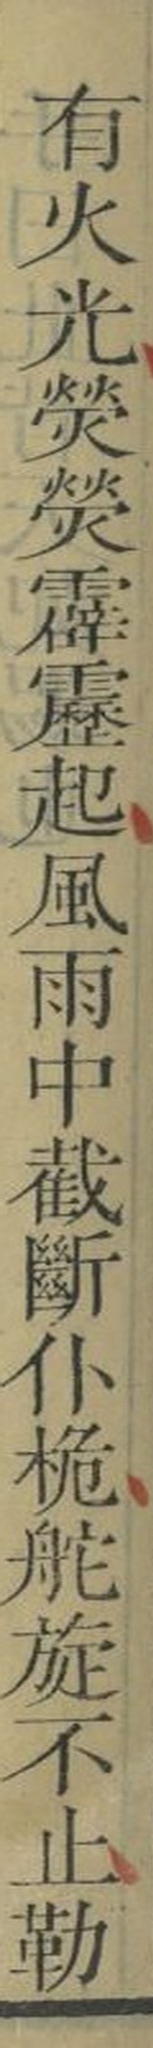有火光熒熒霹靂起風雨中截斷仆桅舵旋不止勒
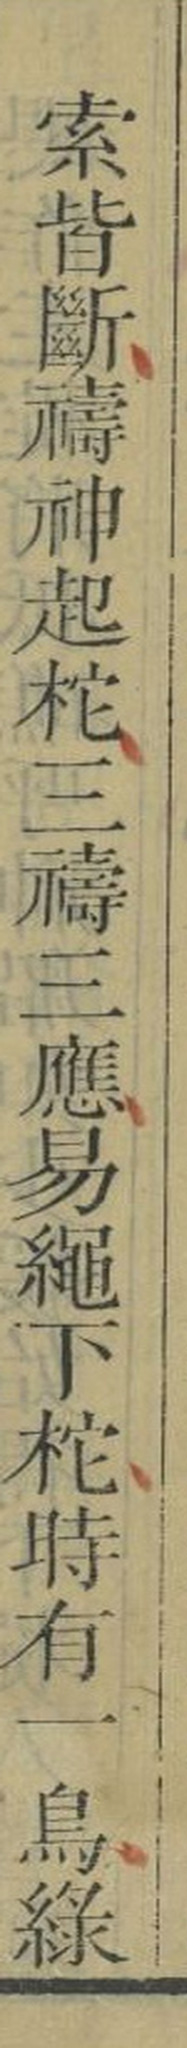索皆斷禱神起柁三禱三應易繩下柁時有一鳥綠
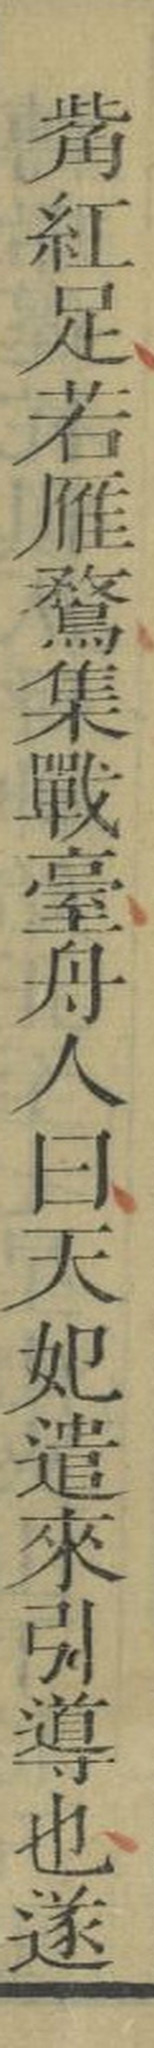觜紅足若雁鶩集戰臺舟人曰天妃遣來引導也遂
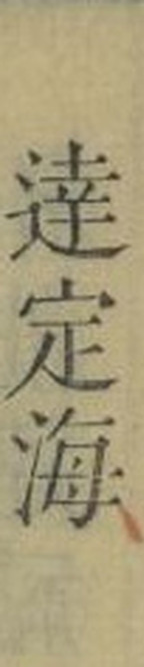逹定海
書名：中山伝信録 巻一、巻二
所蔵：University of the Ryukyus Library
